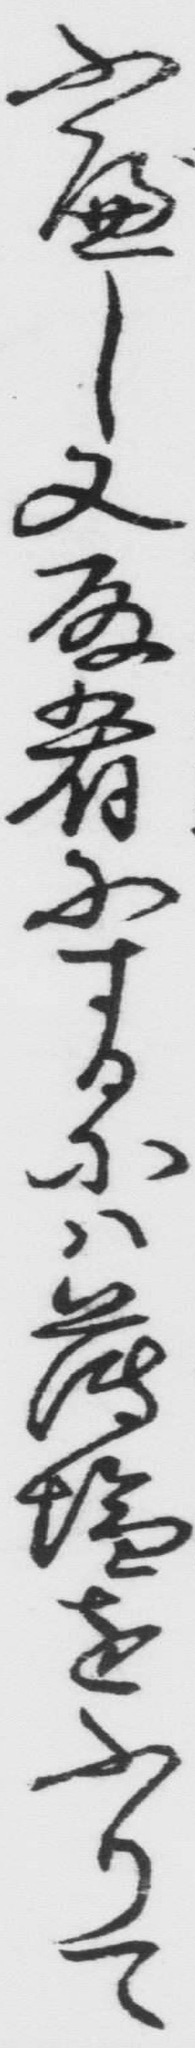ふべし又取肴にするには薄塩をふりて
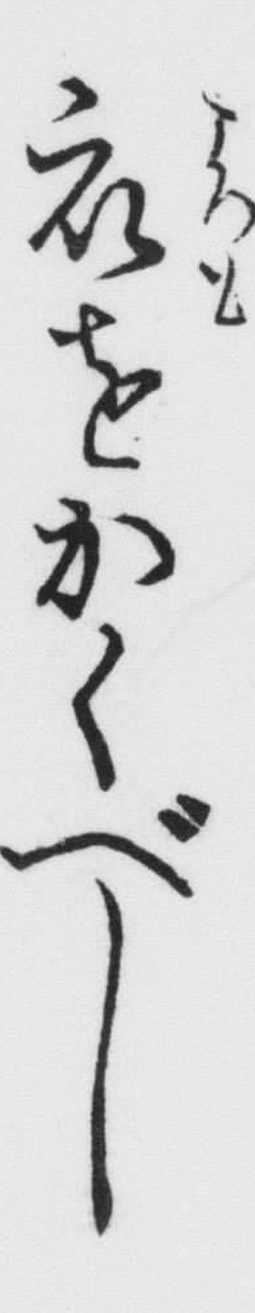衣をかくべし
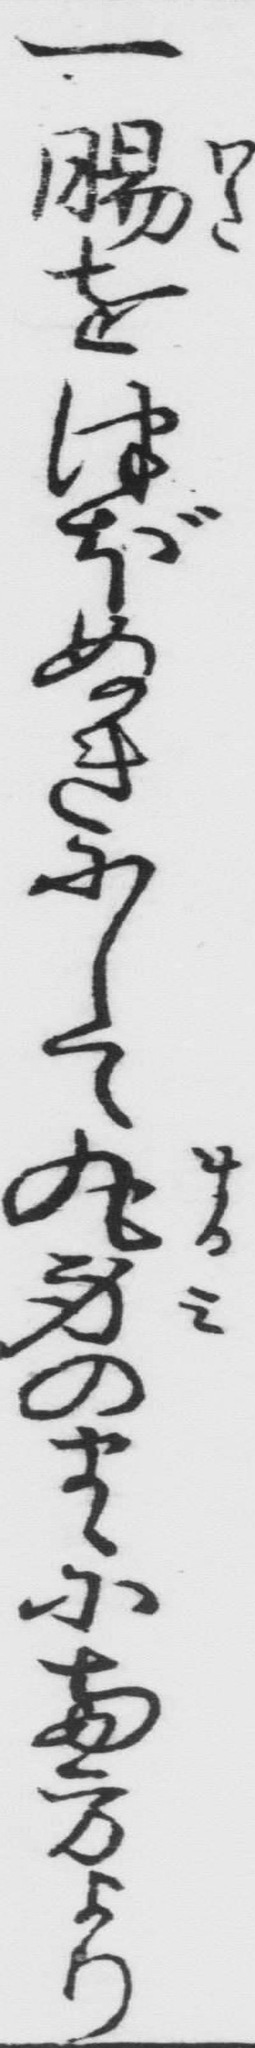一腸をつぼぬきにして丸身のまゝに両方より
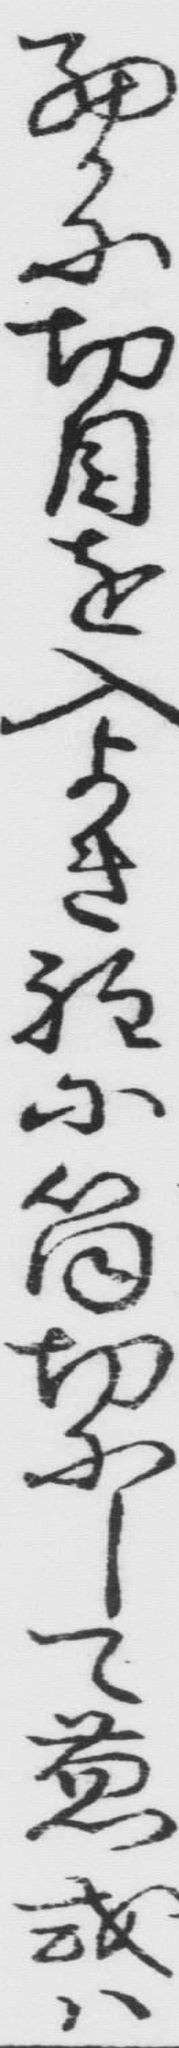細かに切目を入よき程に筒切にして葱或は
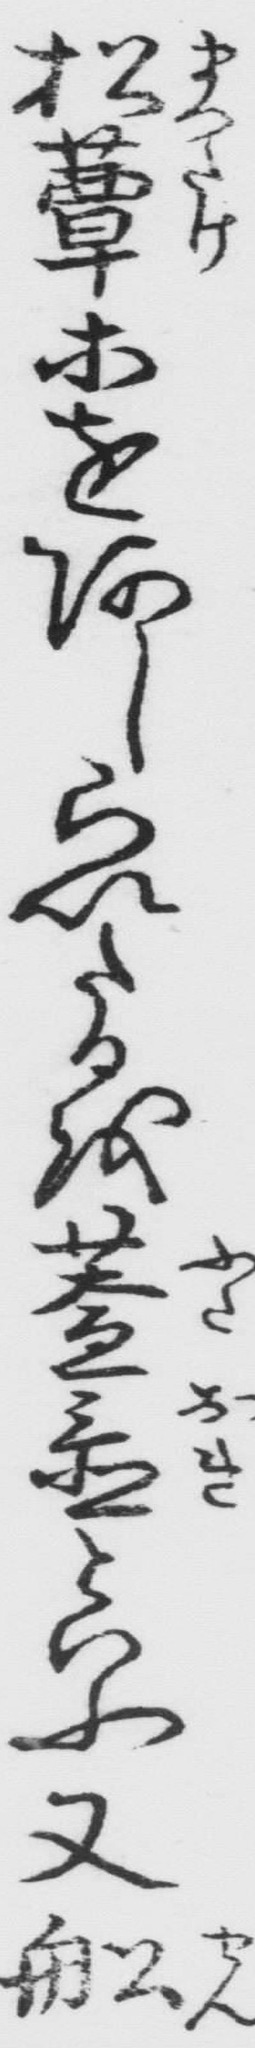松蕈等をあしらいたるを蓋置といふ又船
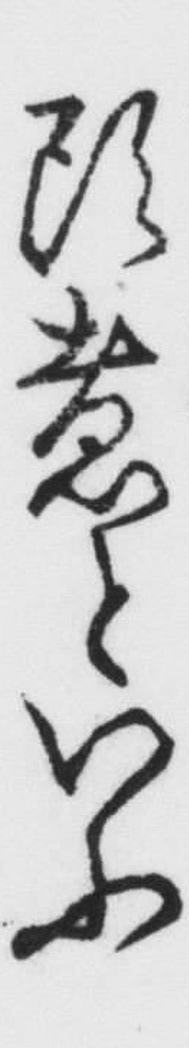頭煮といふ

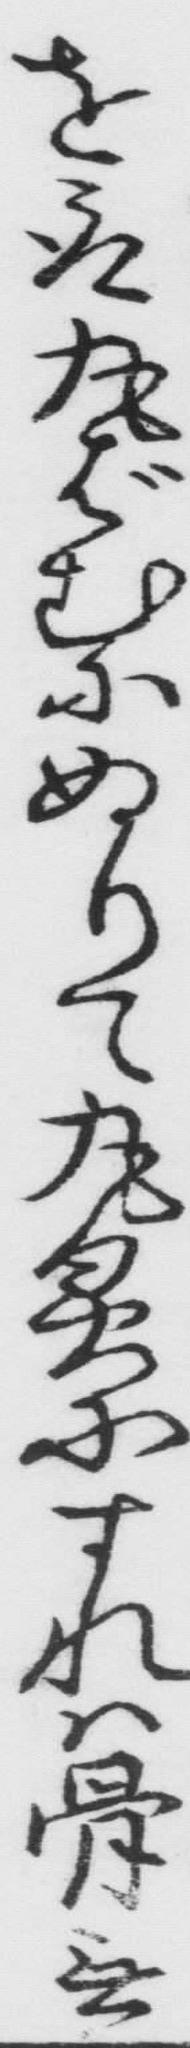を取丸ばむにぬりて丸炙にすれは骨無
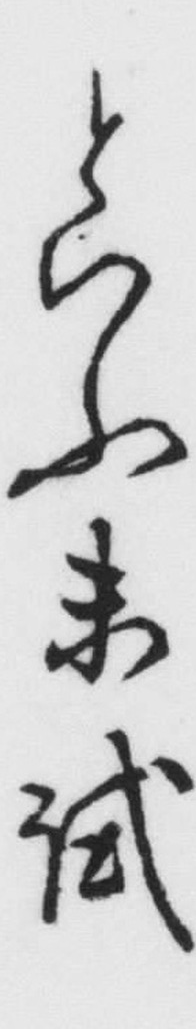といふ未試
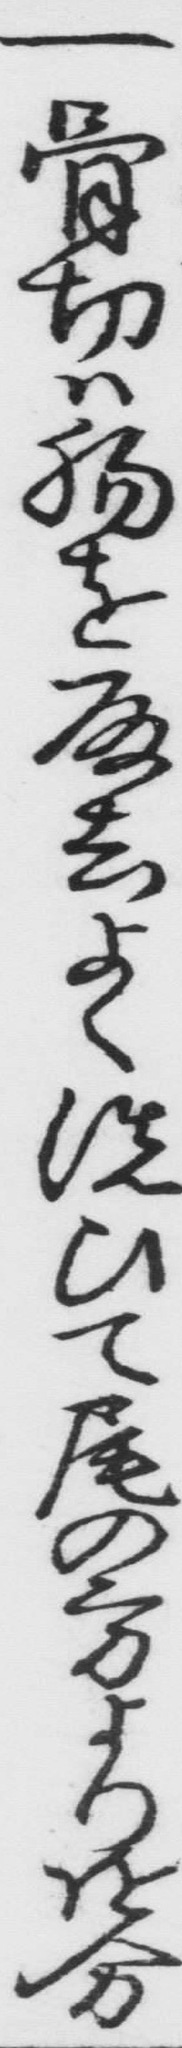一骨切は腹を取去よく洗ひて尾の方より随分
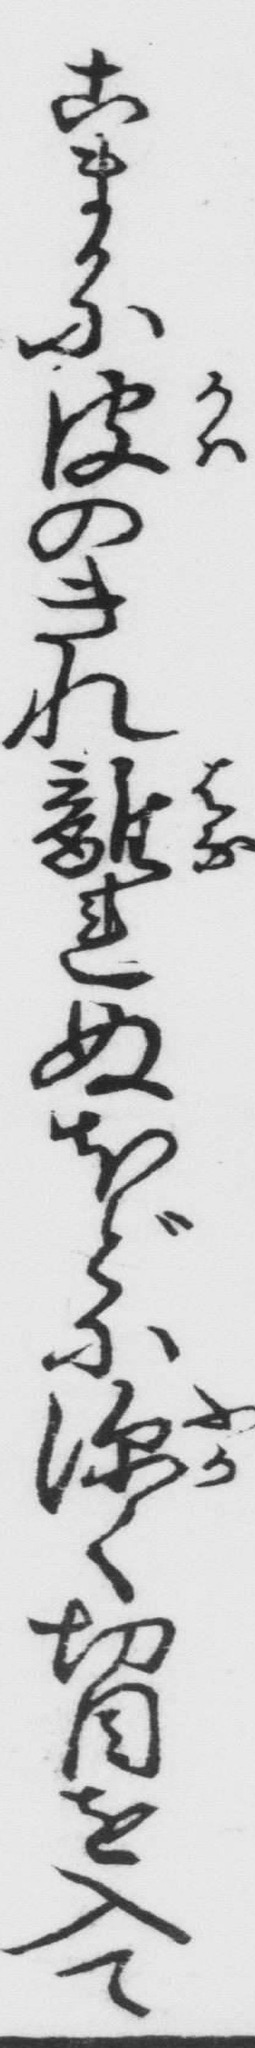こまかに皮のきれ離れぬほど深く切目を入て
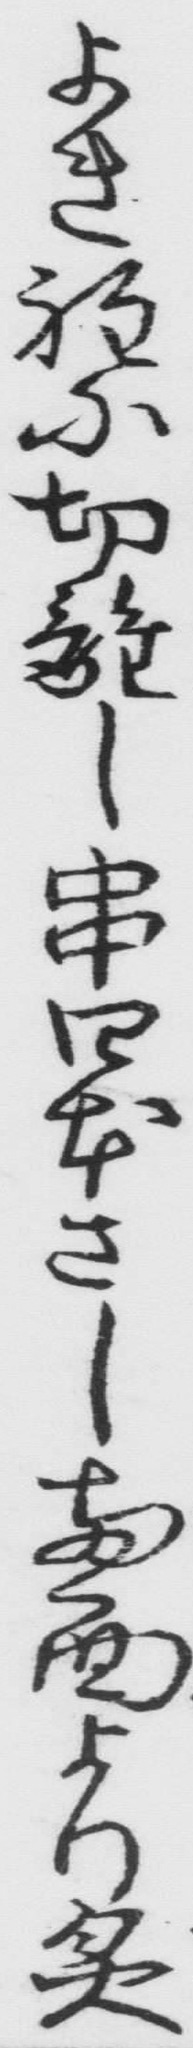よき程に切離し串四本さし両面より炙
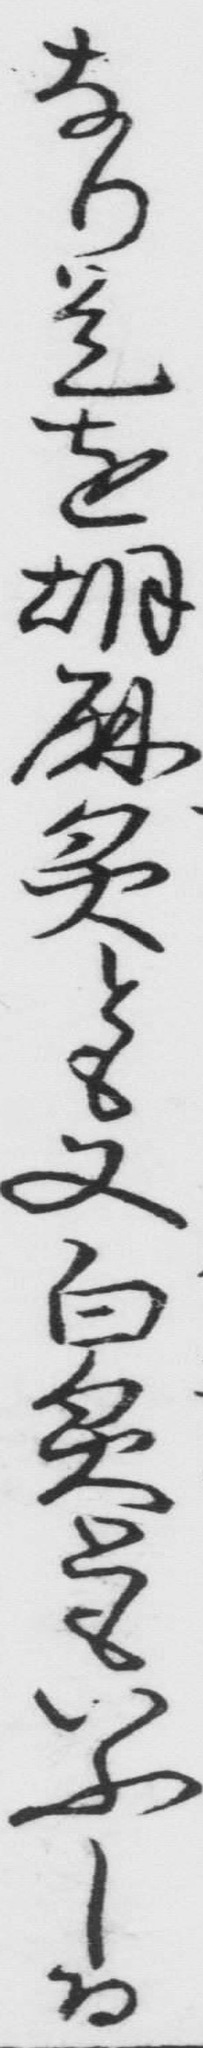なり是を胡麻炙とも又白炙ともいふしる
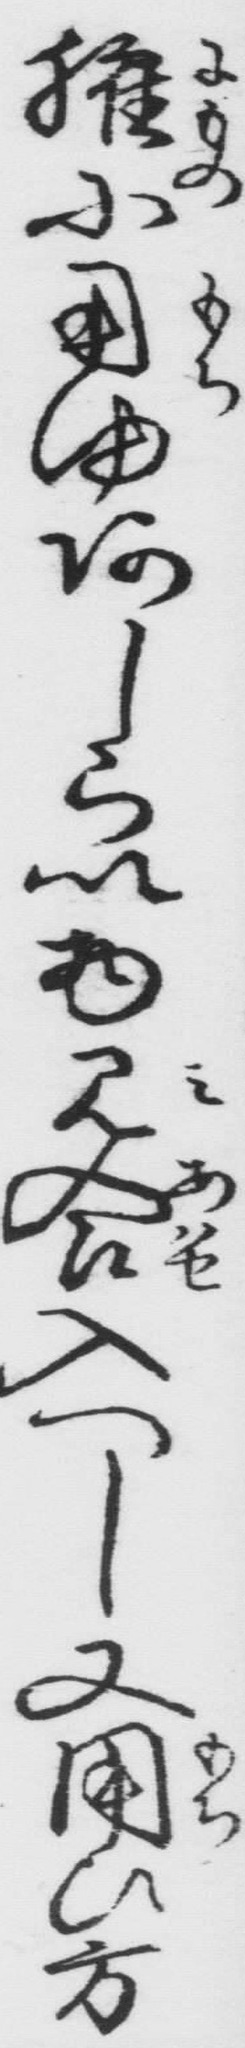臛に用ゆあしらい物見合入へし又用ひ方
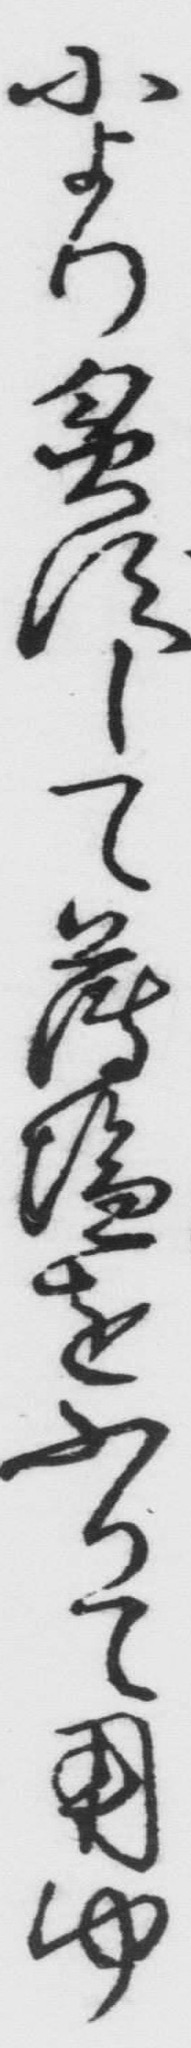により炙ずして薄塩をふりて用ゆ
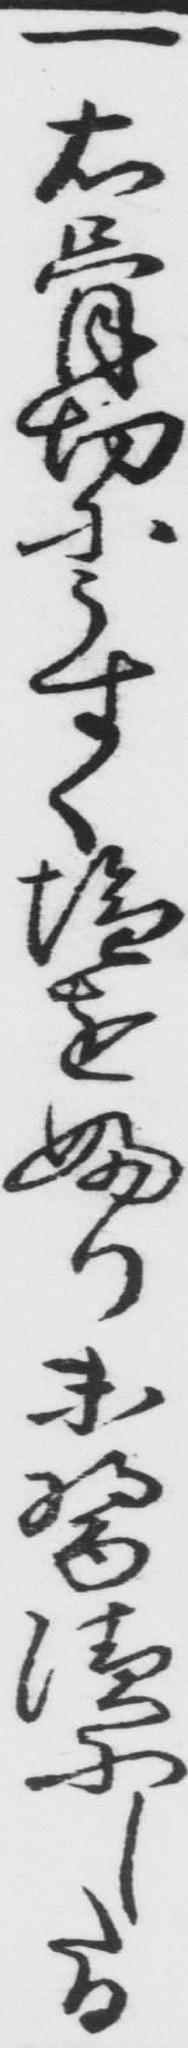一右骨切にうすく塩をふり未醤漬にしたる
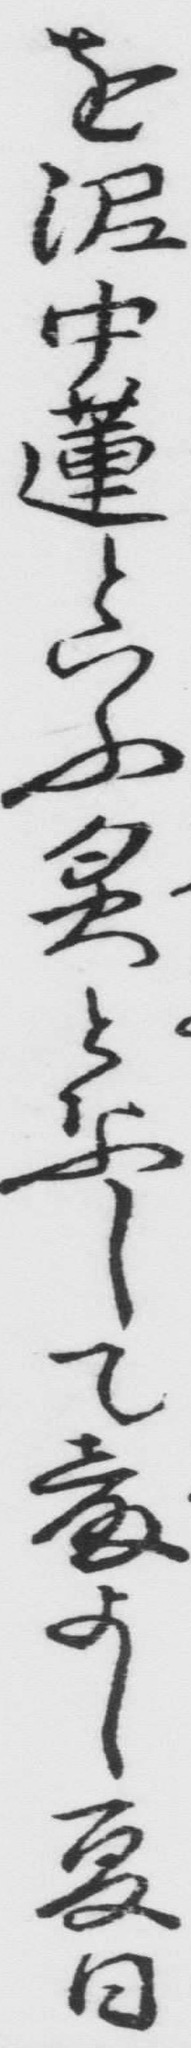を泥中蓮といふ炙となして最よし夏日
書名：海鰻百珍
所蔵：大阪府立大学学術情報センター 国文学研究資料館
